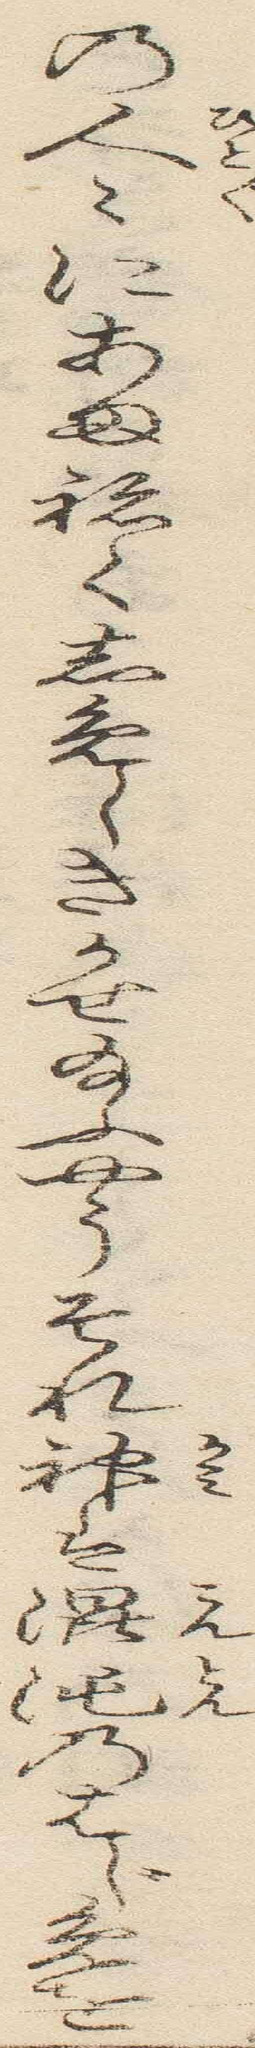の人〻にあまねくしめしきかせ給ふやうそれ神は混沌のはじめを
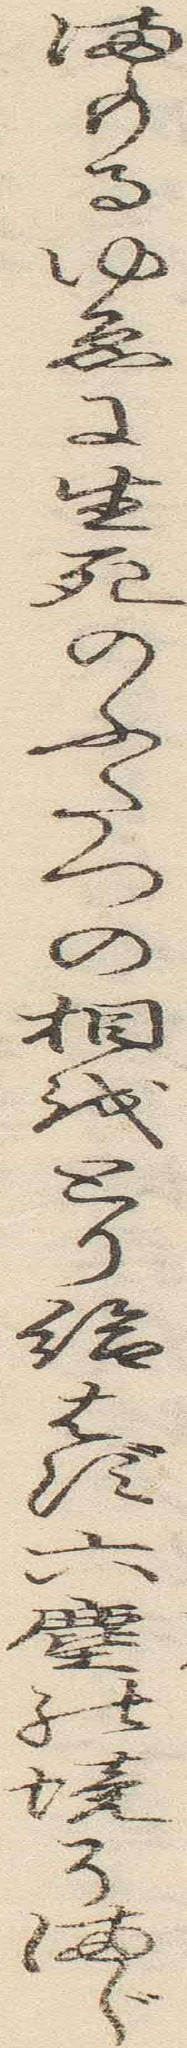まもるゆゑに生死のふたつの相をとり給はず六塵の境にまじ
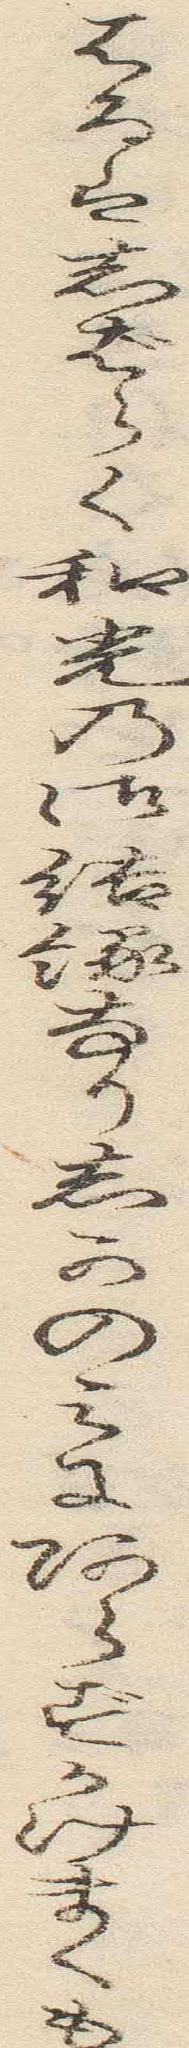はるはしばらく和光の御結縁なりしかのみにあらずかけまくも
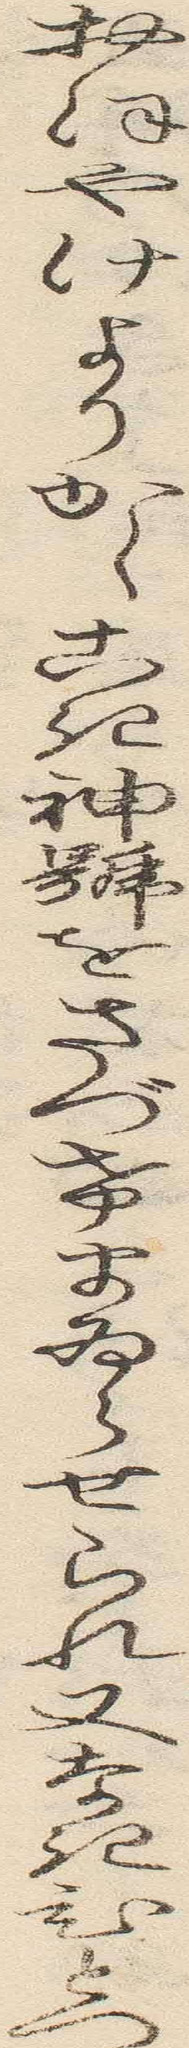おほやけよりかしこき神號をさづけまゐらせられ又なきひとつ
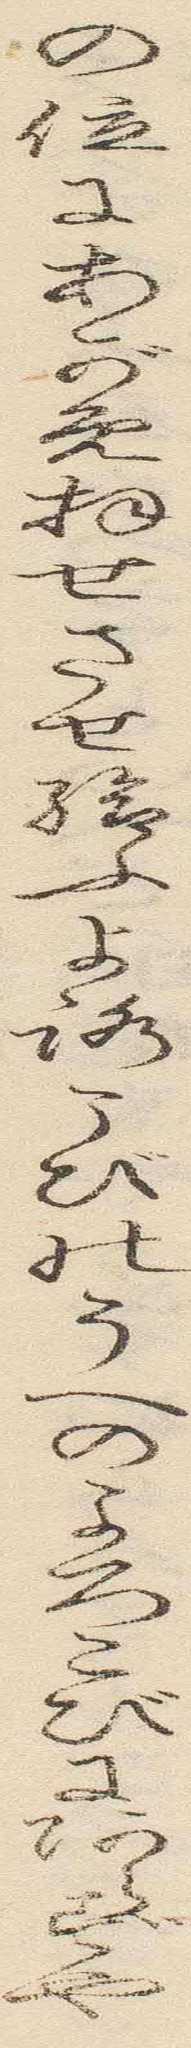の位にあがめ拝せさせ給ふよろこびのうへのよろこびにあらずや
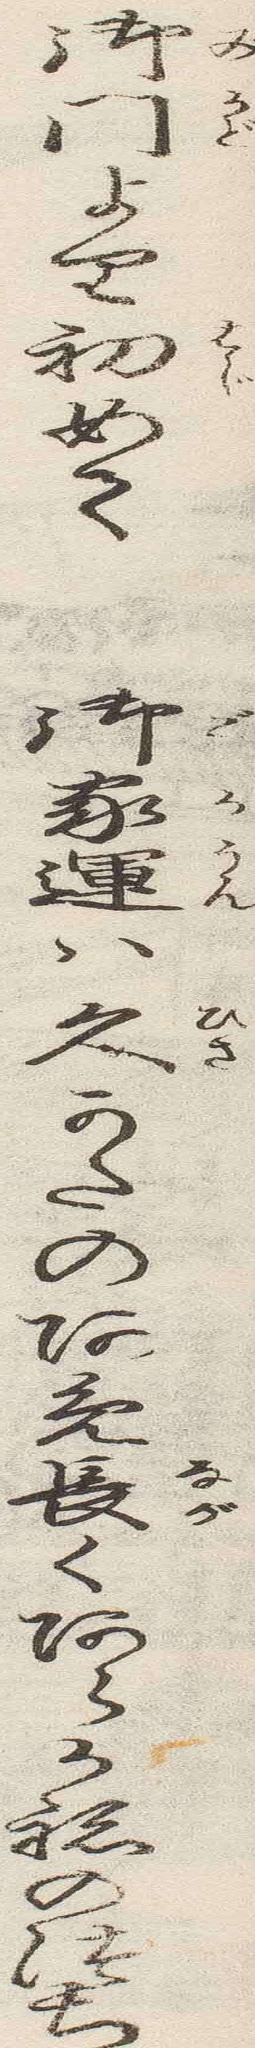御門より初めて御家運は久かたのあめ長くあらかねのつち
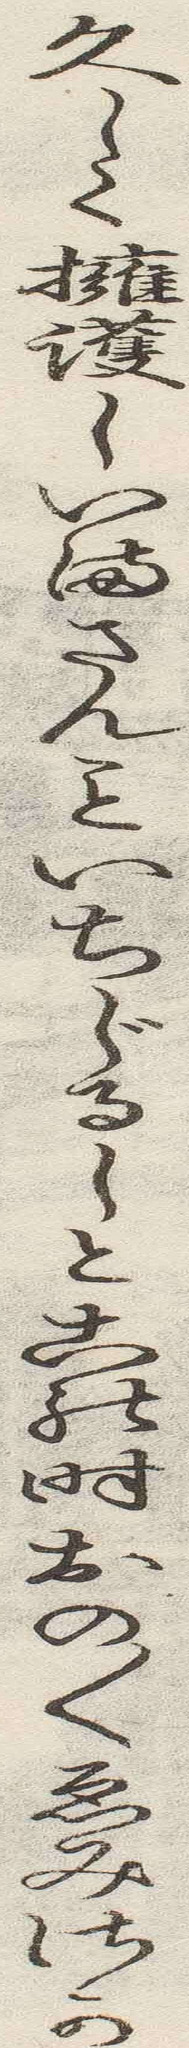久しく擁護しいまさんこといちじるしとこの时おの〳〵ゑみさか
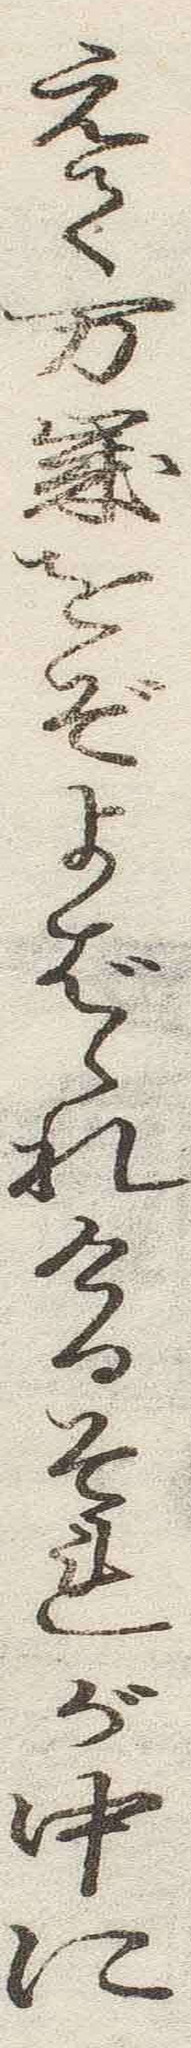えて万歳をぞよばられけるそれが中に
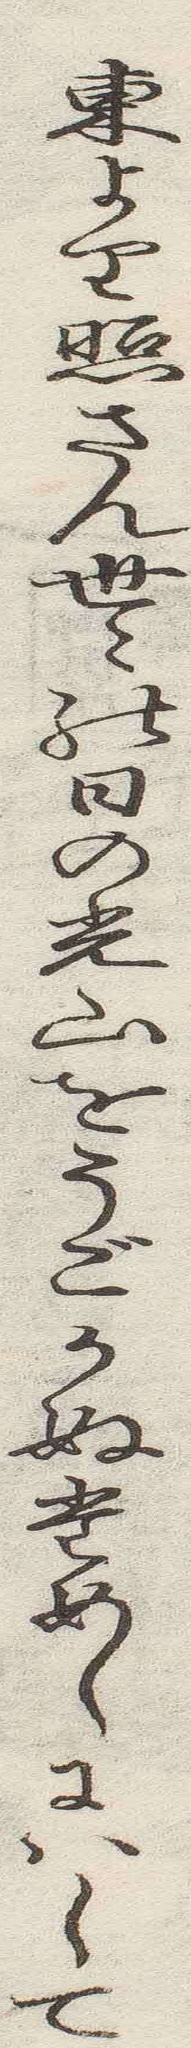東より照さん世〻の日の光山をうごかぬためしにはして
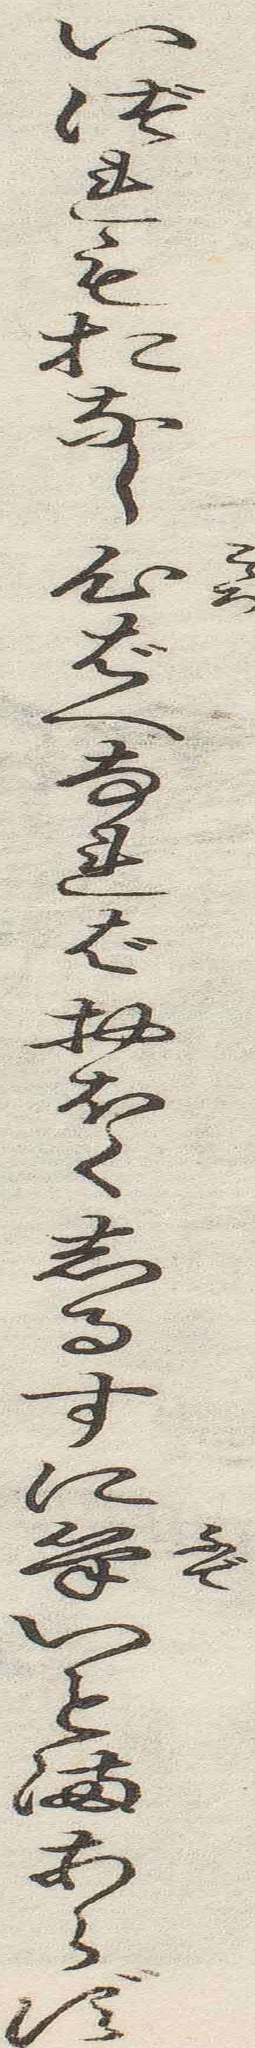いづれもおなし心ばへなればおほくしるすに筆いとまあらず
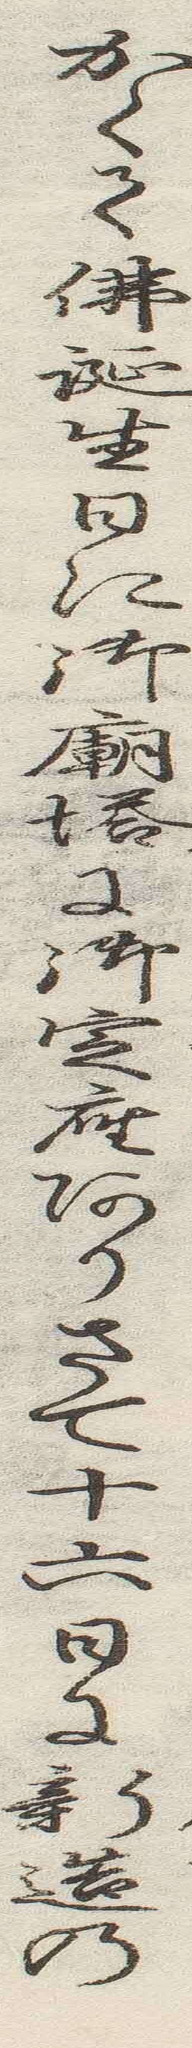かくて佛誕生日に御廟塔に御定座ありさて十六日に新造の
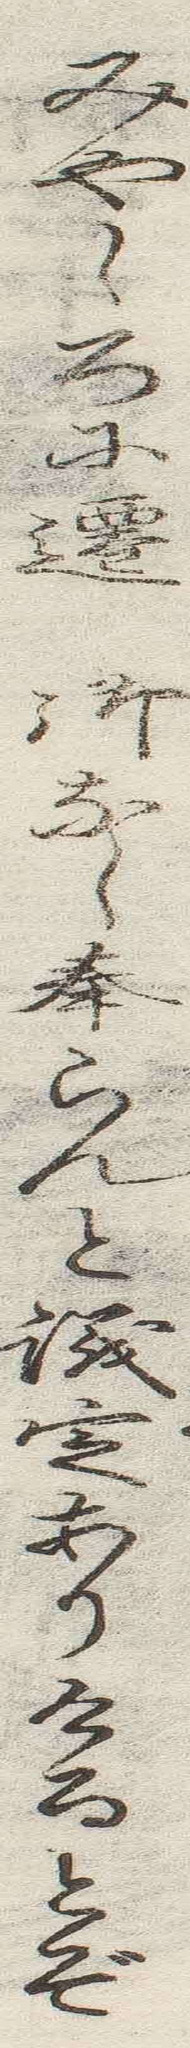みやしろに遷御なし奉らんと議定ありけるとぞ
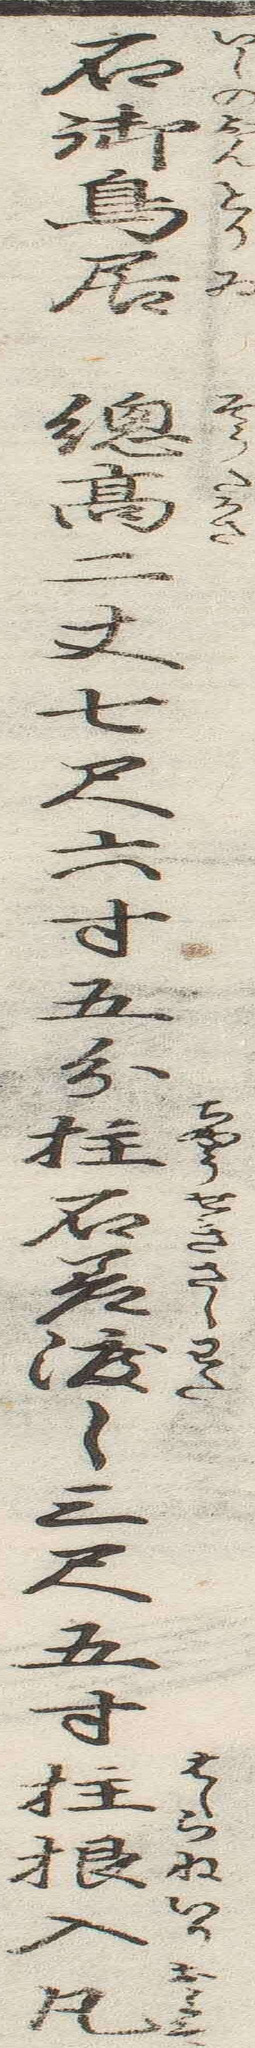石御鳥居總髙二丈七尺六寸五分柱石差渡し三尺五寸柱根入凡
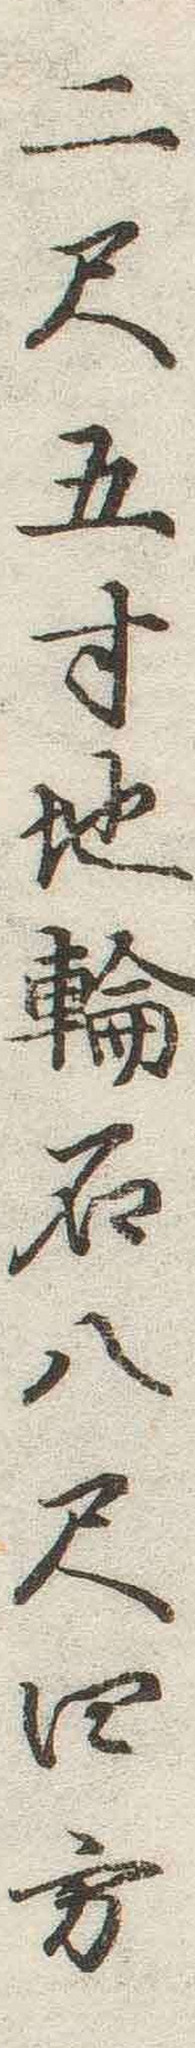二尺五寸地輪石八尺四方
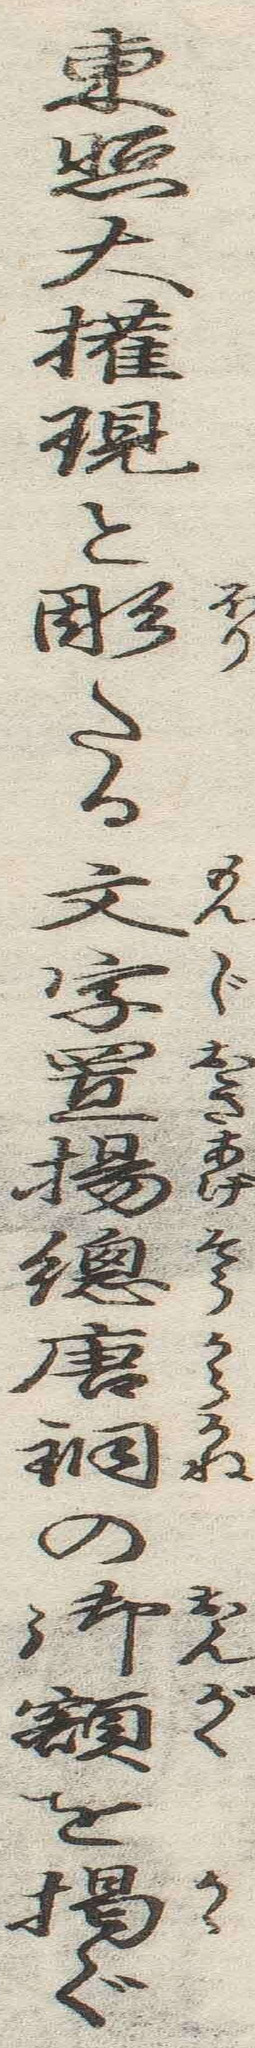東照大権兼現と彫たる文字置揚總唐銅の御額を掲ぐ
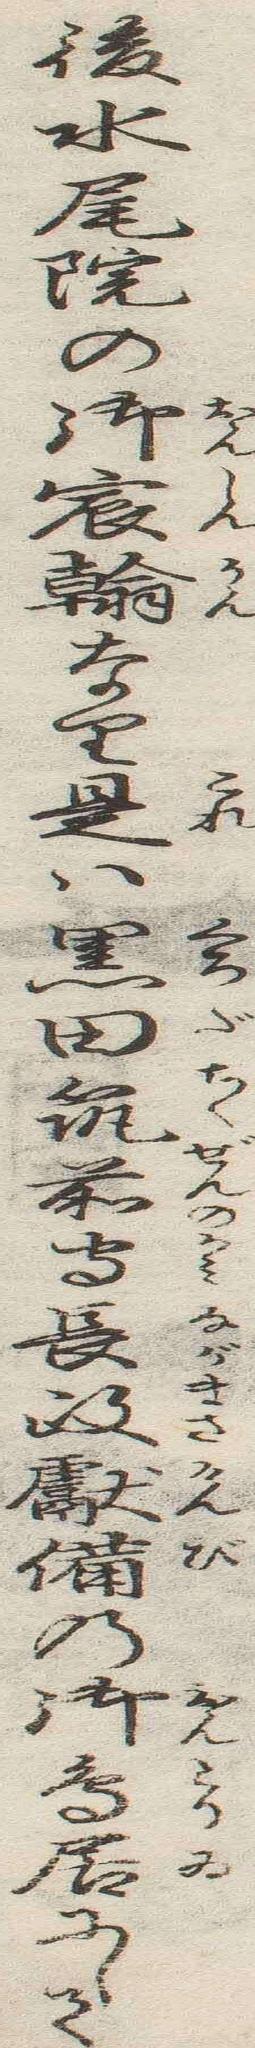後水尾院の御宸翰なり是は黒田筑前守長政獻備の御鳥居にして
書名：日光山志
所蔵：東京学芸大学附属図書館 国文学研究資料館
